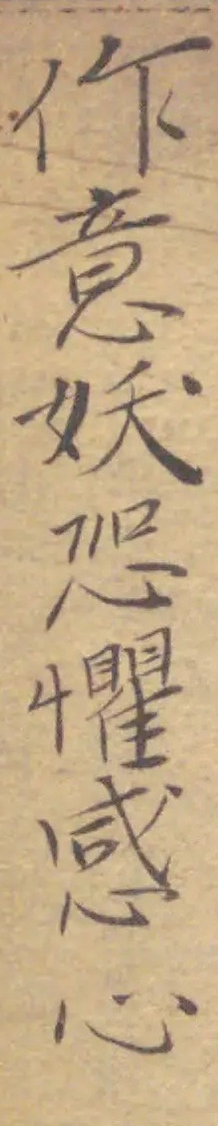作意妖怨懼感心完
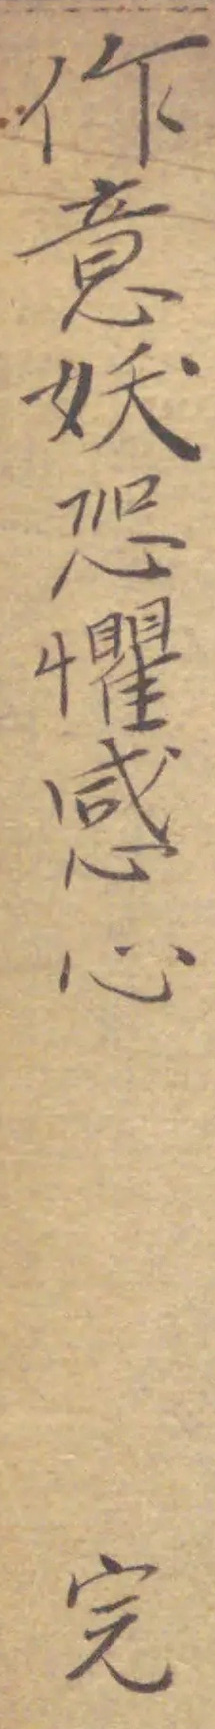作意妖怨懼感心完

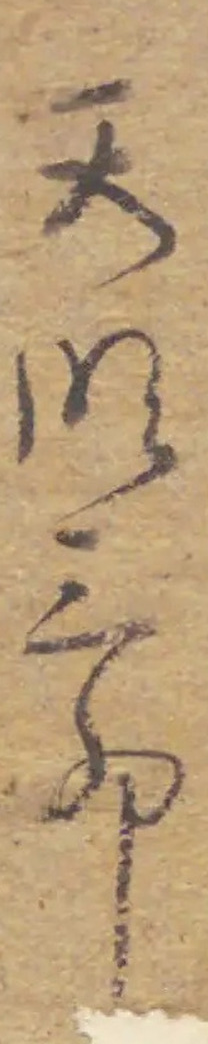天明三卯

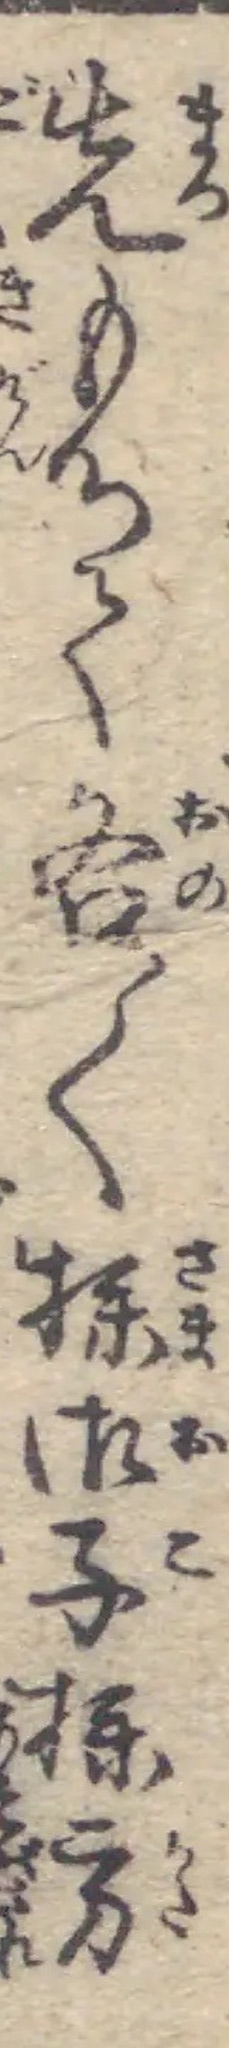先もつて各〳〵様御子様方
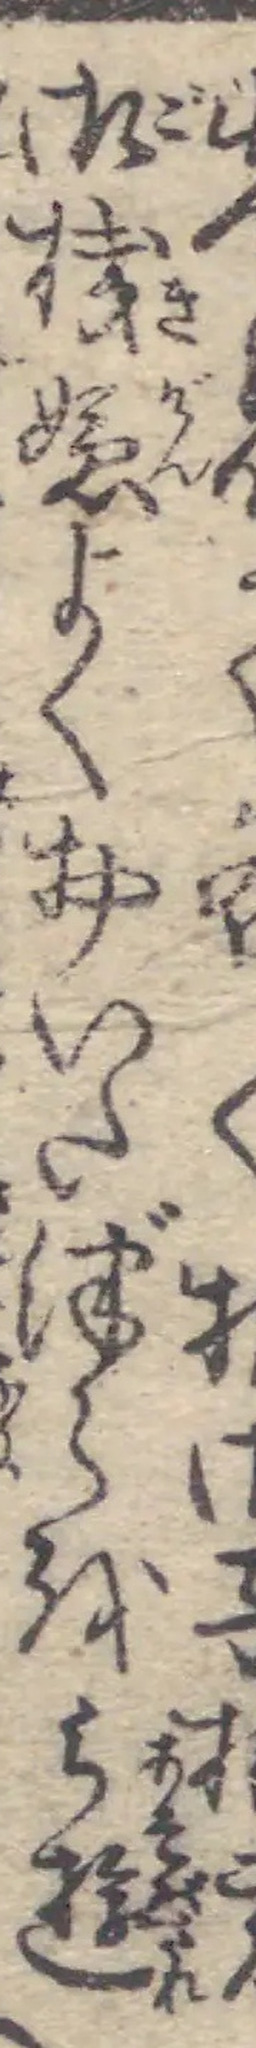御機嫌よくおいたづらを被遊
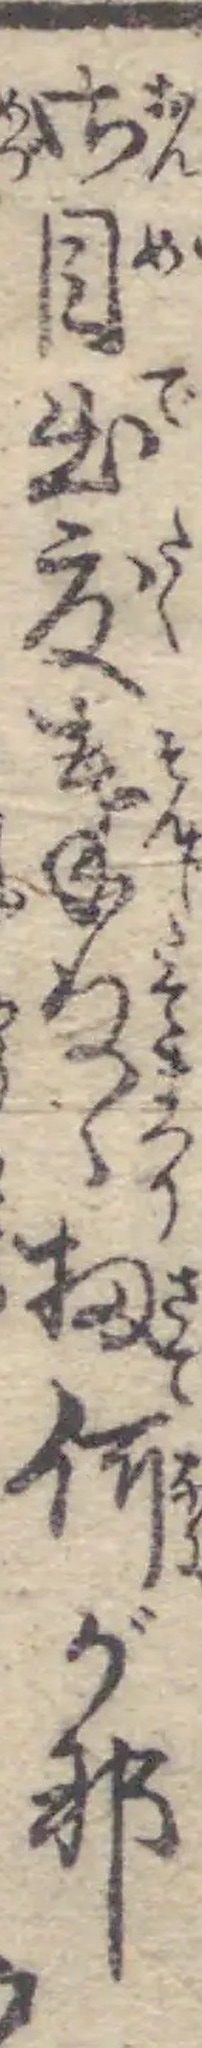御目出度奉存候扨何がな
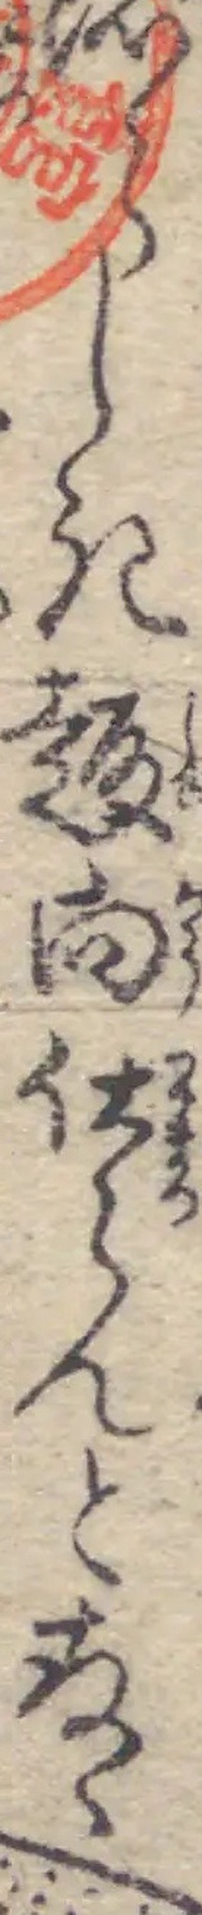珍らしき趣向仕らんと存候
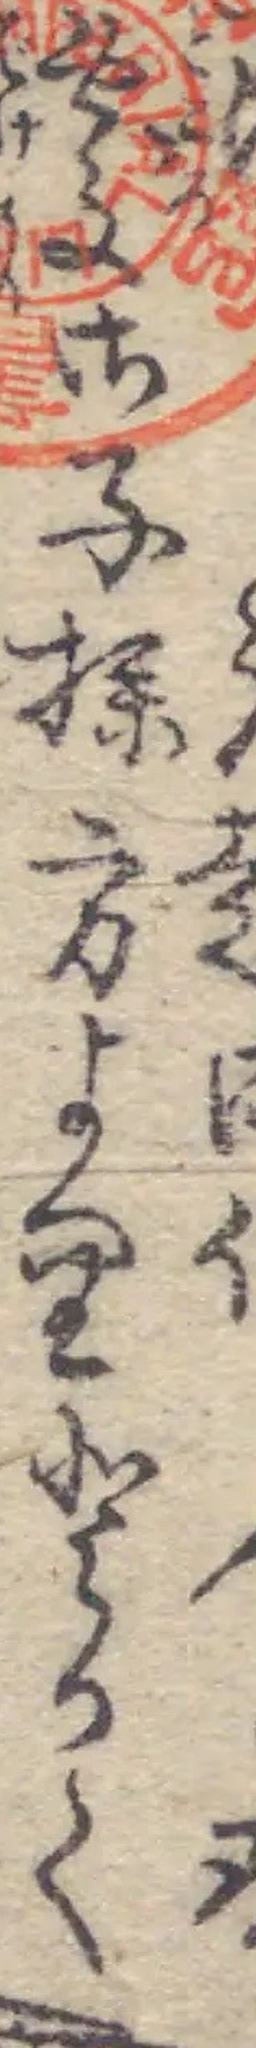處に御子様よりとかく
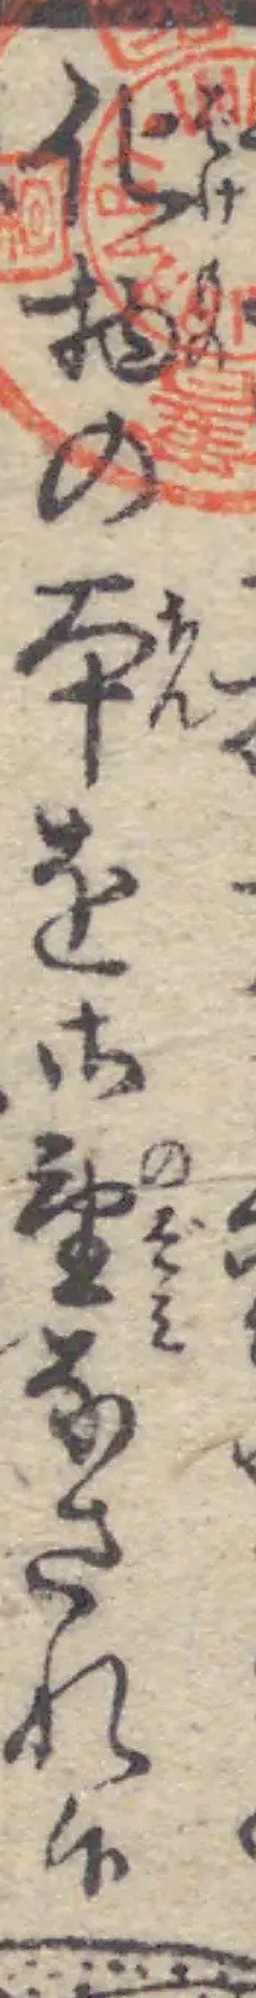化物の本を御望なされ候
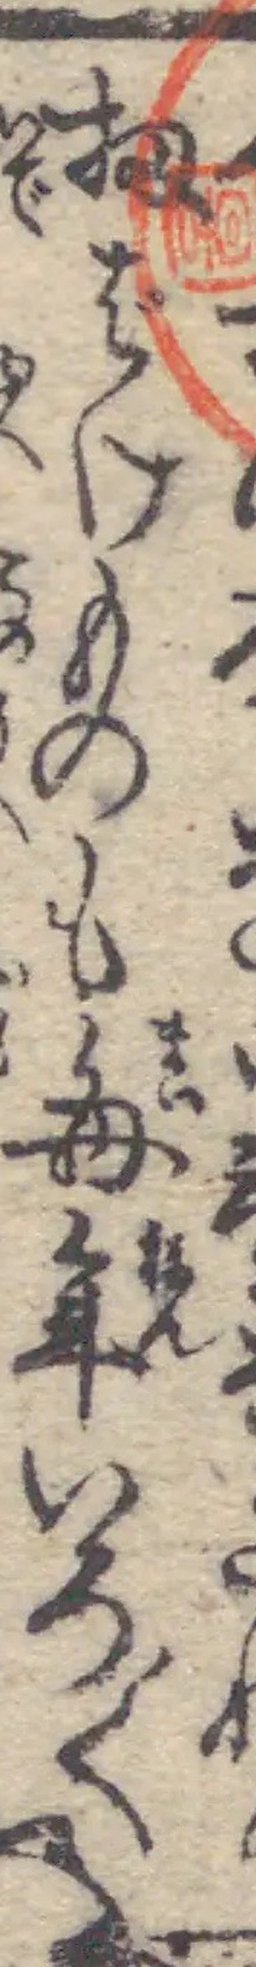扨ばけものも毎年いろ〳〵
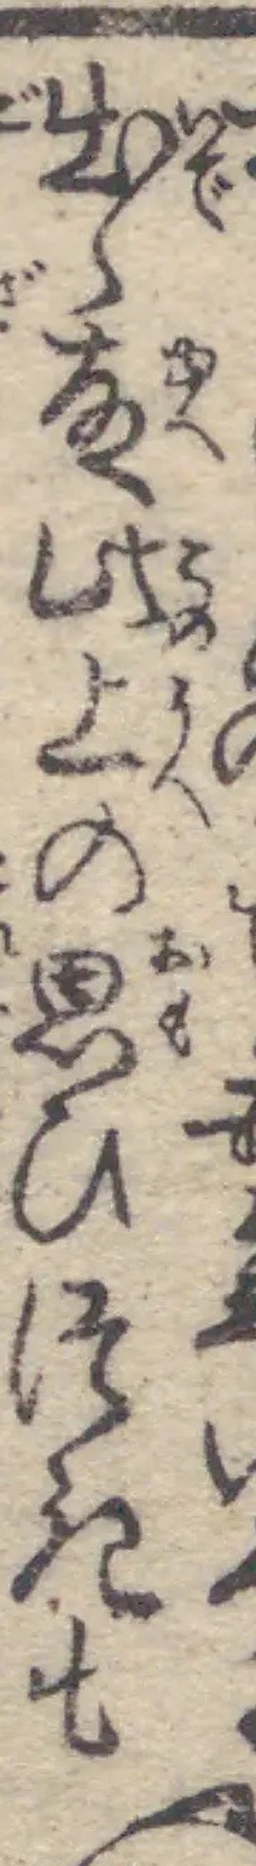出候故此上の思ひつきも
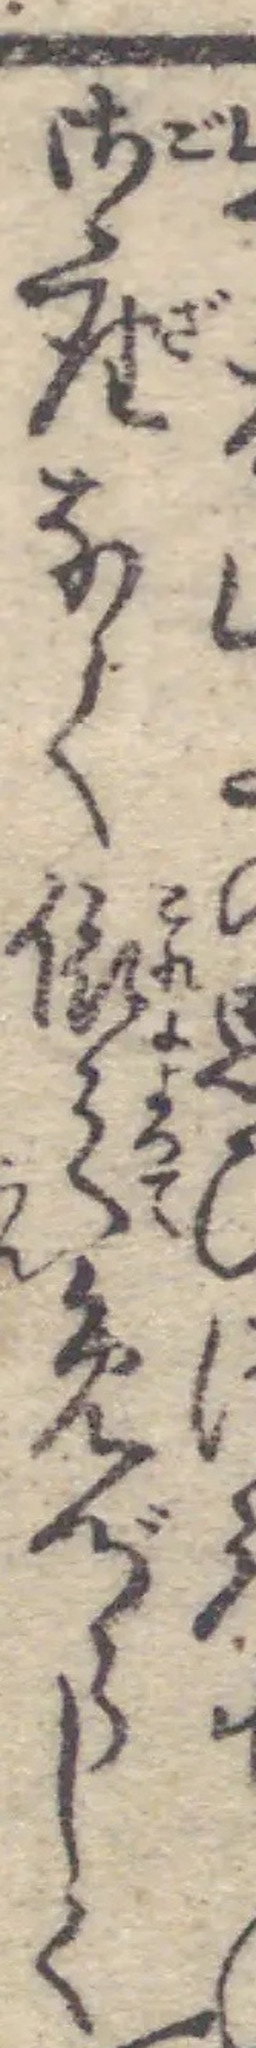御座なく依是めづらしく
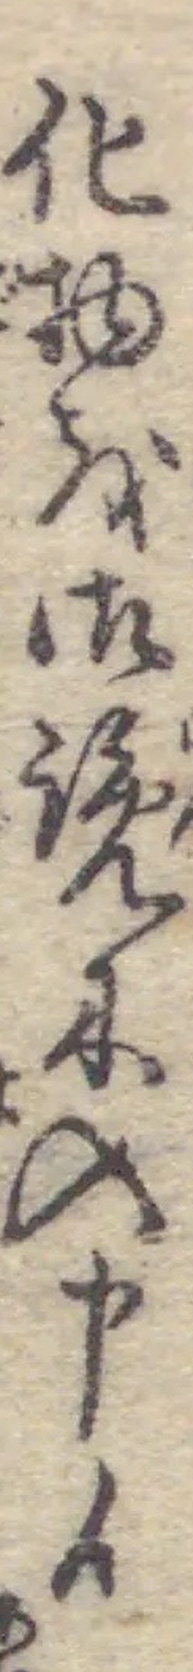化物を御覧に入申候
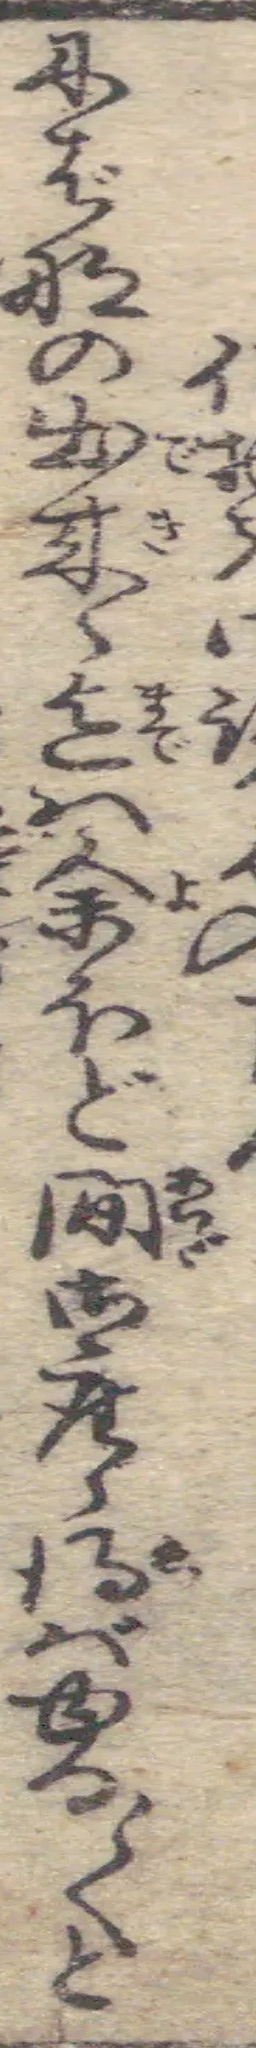にばなの出来候迄は余ほど間御座候得ばゆる〳〵と
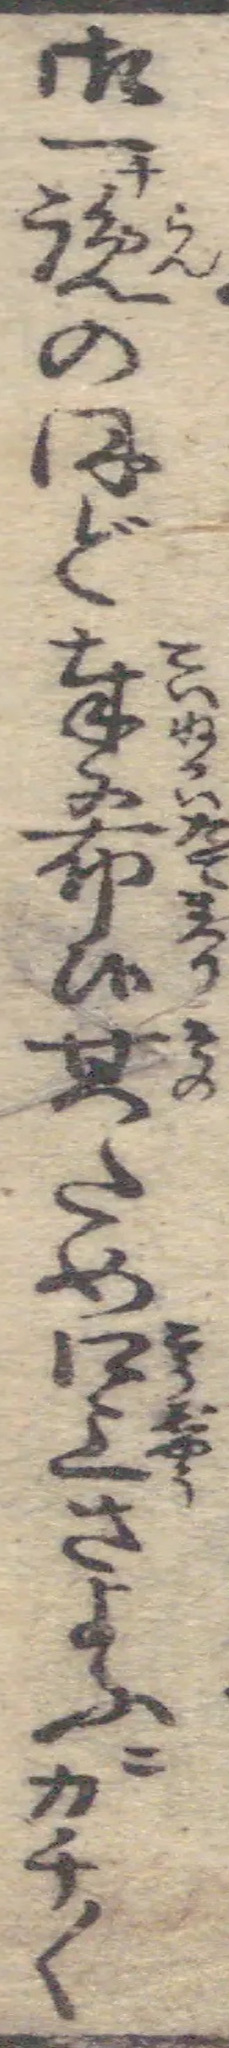御一覧のほど奉希候其ため口上さよふにカチ〳〵

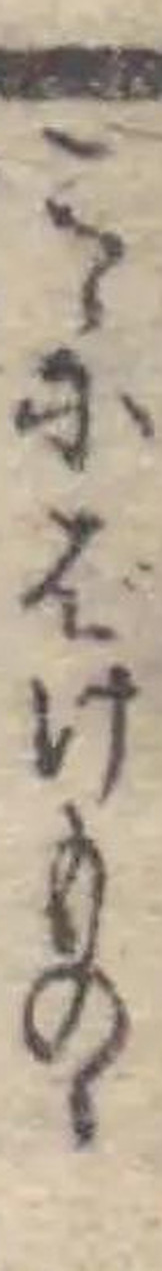こゝにばけものゝ
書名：作意妖恐懼感心 2巻
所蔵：国立国会図書館 National Diet Library, JAPAN
